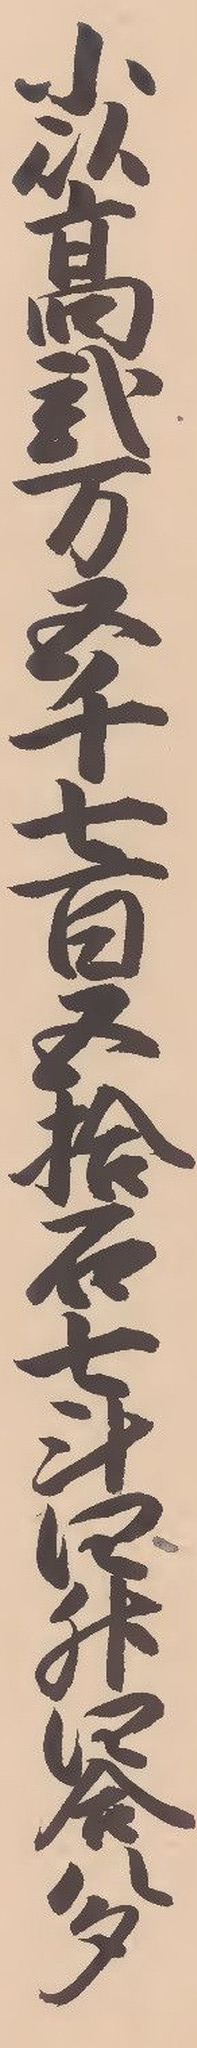小以高弐万五千七百五拾石七斗四升四合八勺
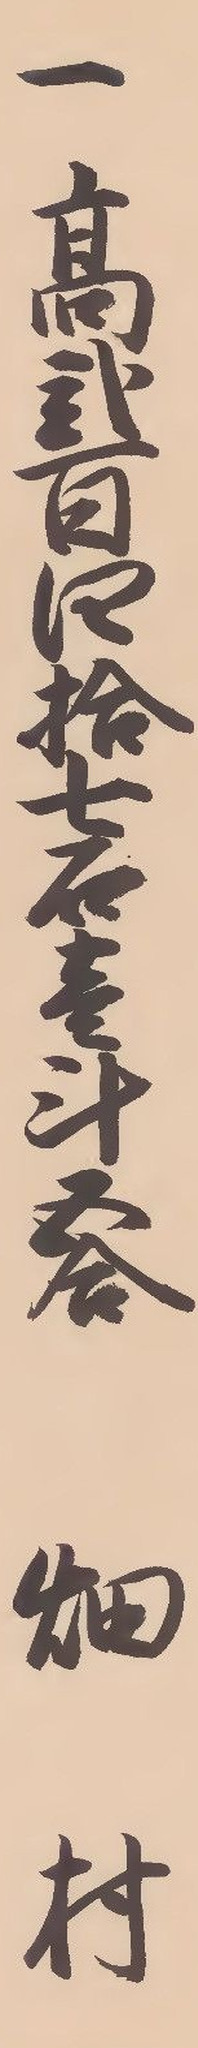一高弐百四拾七石壱斗五合畑村
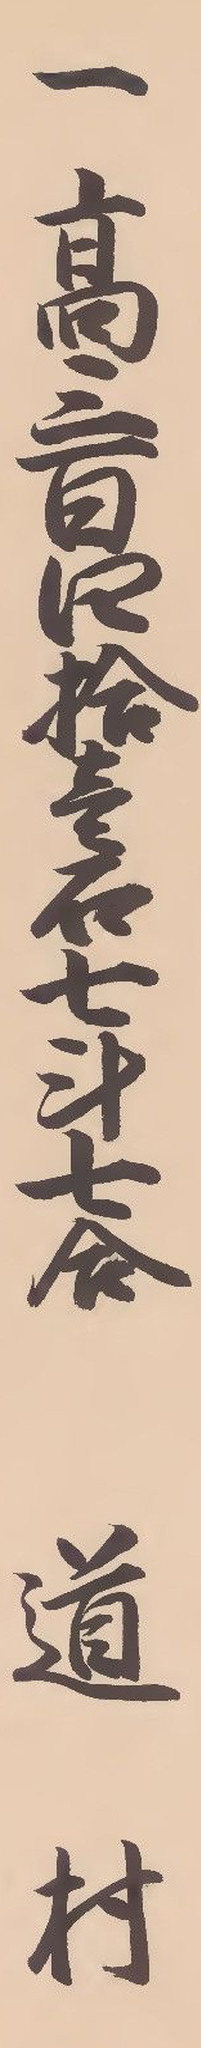一高三百四拾壱石七斗七合道村
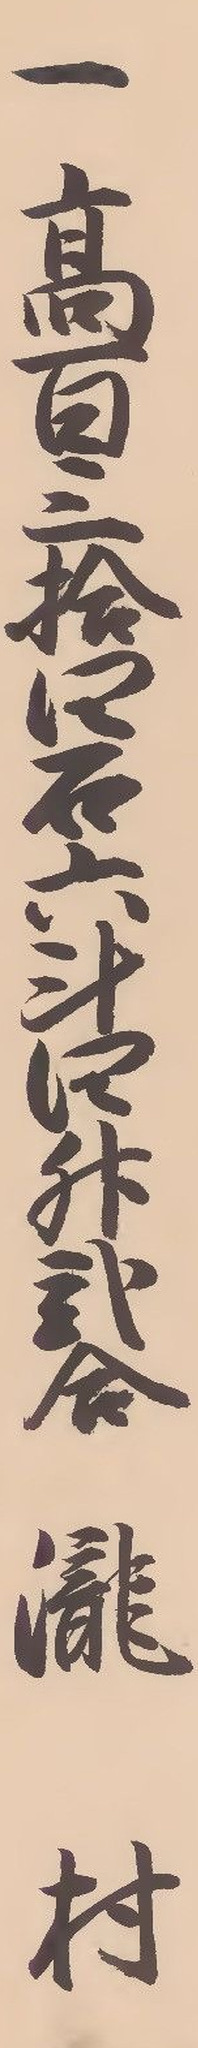一高百三拾四石六斗四升弐合滝村

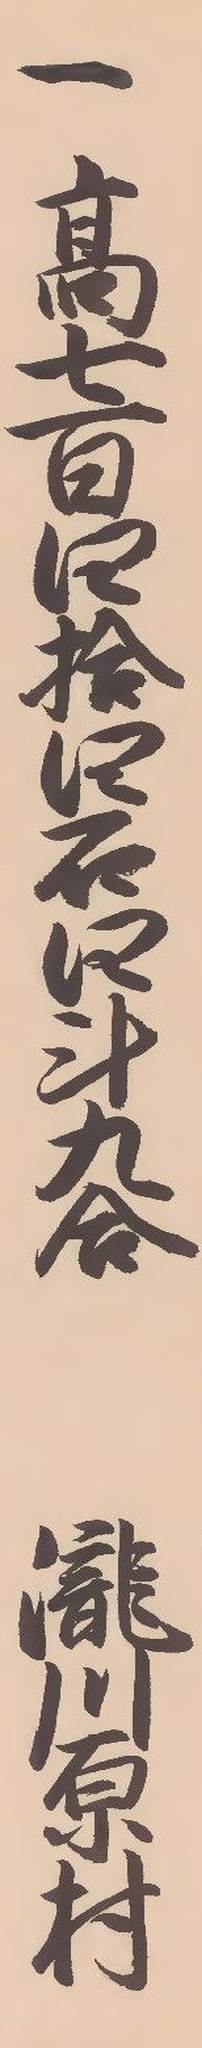一高七百四拾四石四斗九合滝川原村
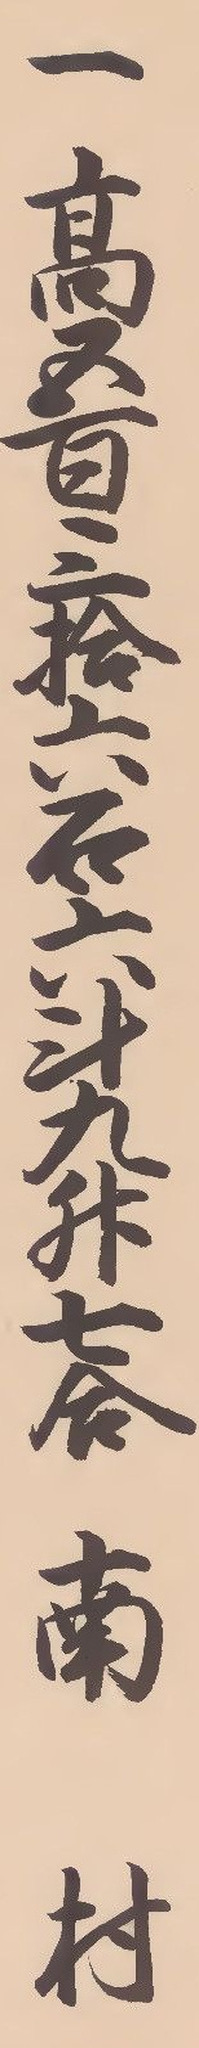一高五百三拾六石六斗九升七合南村
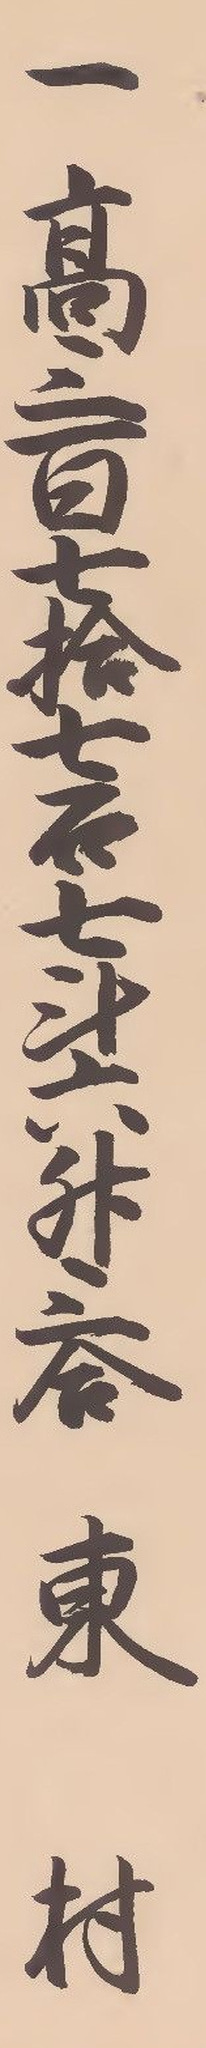一高三百七拾七石七斗六升三合東村
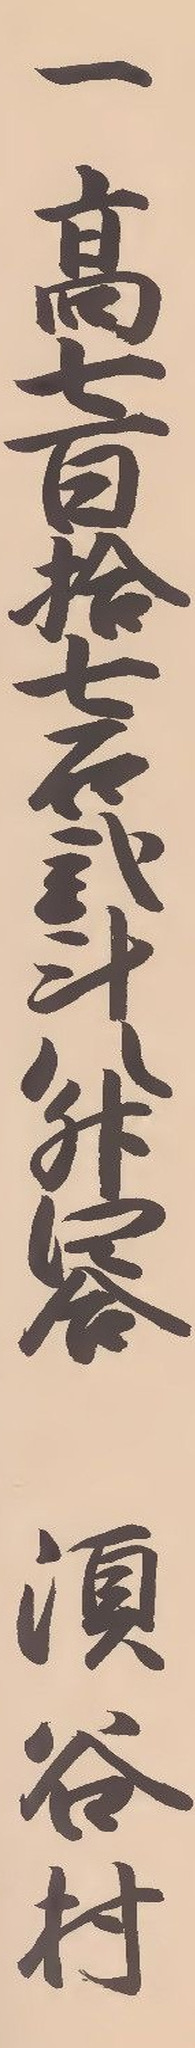一高七百拾七石弐斗八升四合須谷村
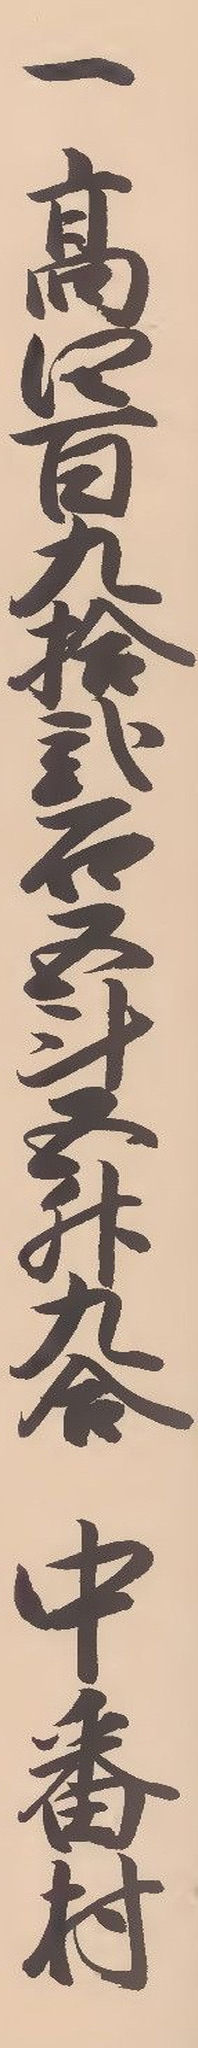一高四百九拾弐石五斗五升九合中番村
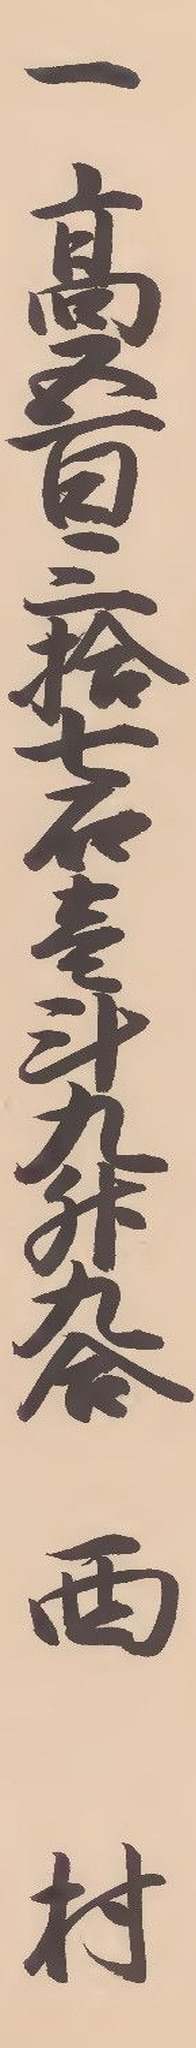一高五百三拾七石壱斗九升九合西村
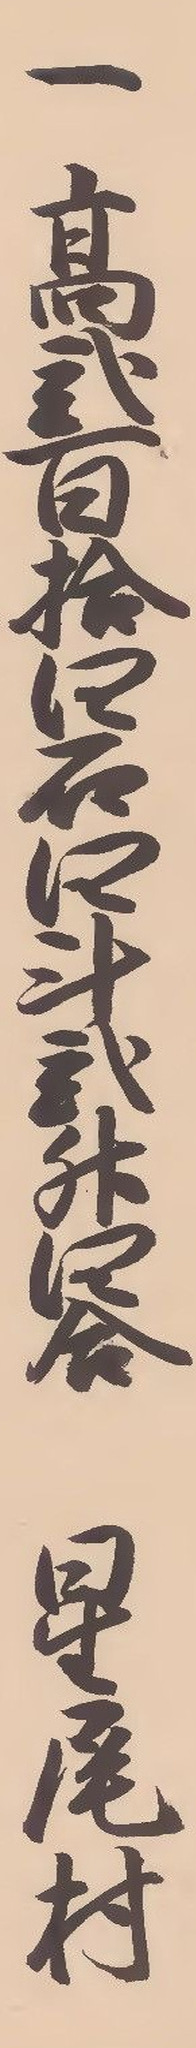一高弐百拾四石四斗弐升四合星尾村
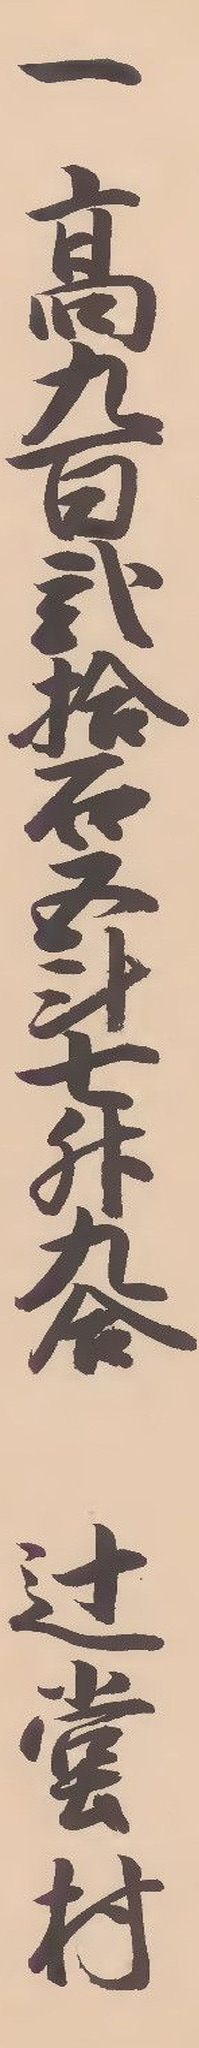一高九百弐拾石五斗七升九合辻堂村

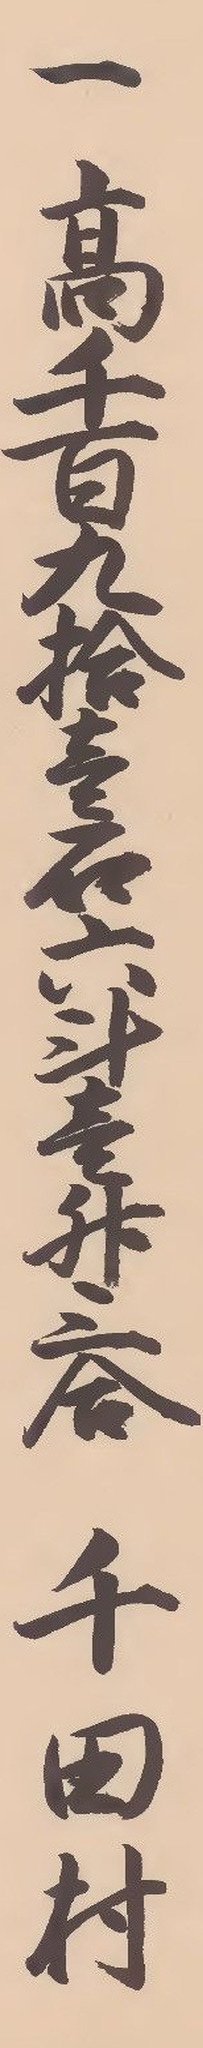一高千百九拾壱石六斗壱升三合千田村
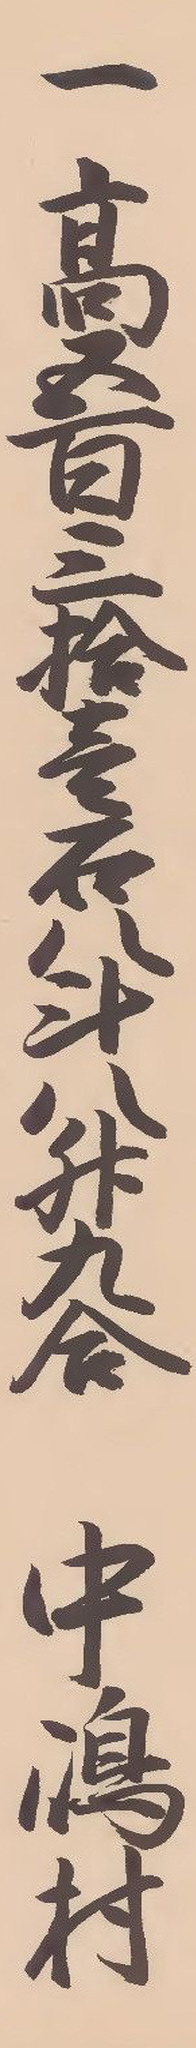一高五百三拾壱石八斗八升九合中島村
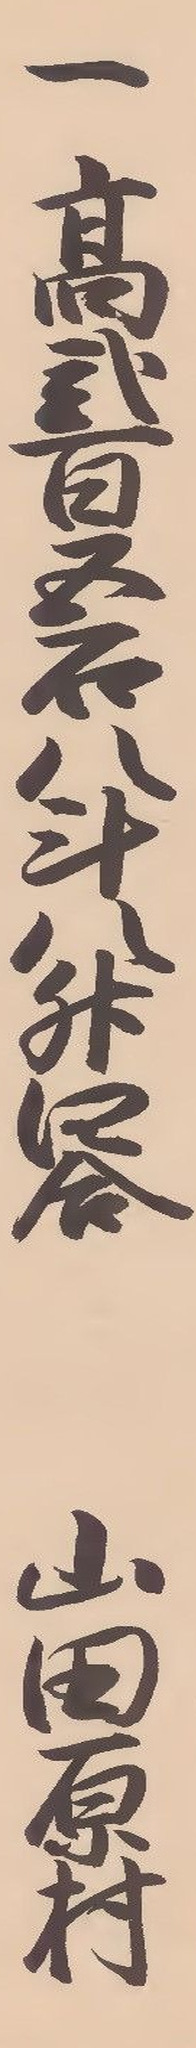一高弐百五石八斗八升四合山田原村
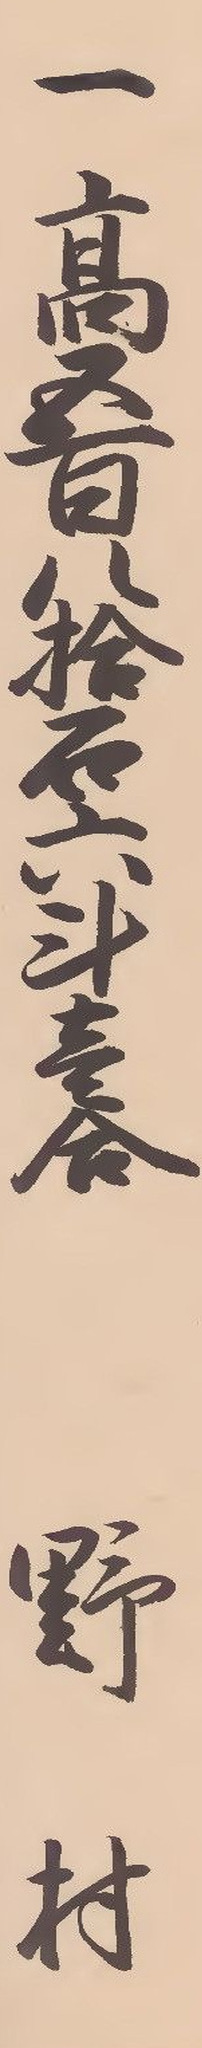一高五百八拾石六斗壱合野村
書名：紀伊国郷帳
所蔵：国立公文書館 National Archives of Japan
